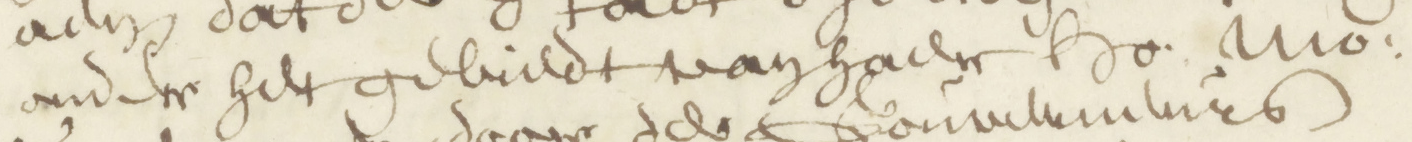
onder het gebiedt van haer Ho:Mo:
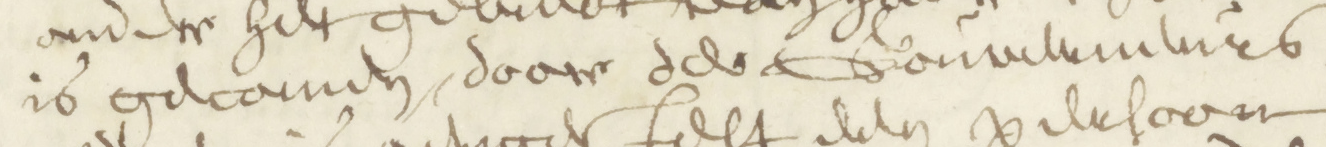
is gecomen, door de Gouverneurs
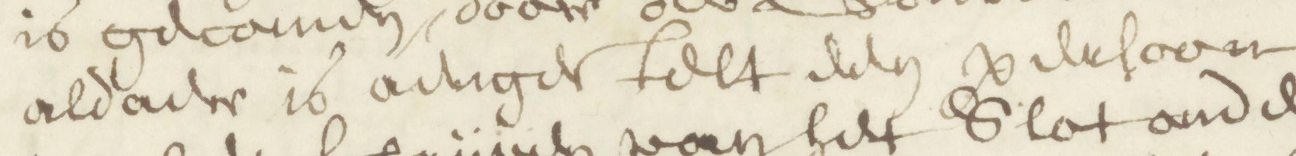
aldaer is aengestelt een persoon
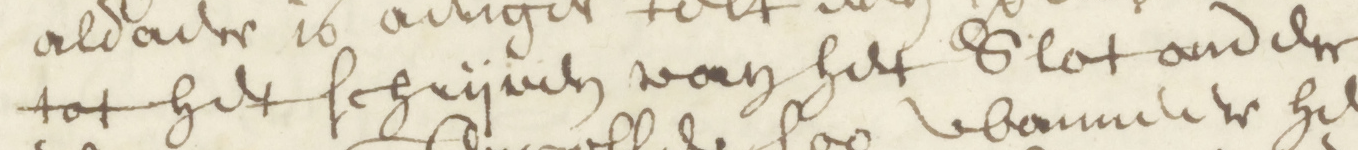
tot het schrijven van het Slot onder
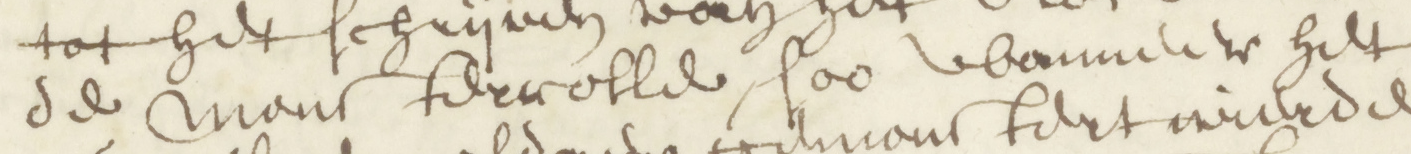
de monsterrollen, soo wanneer het
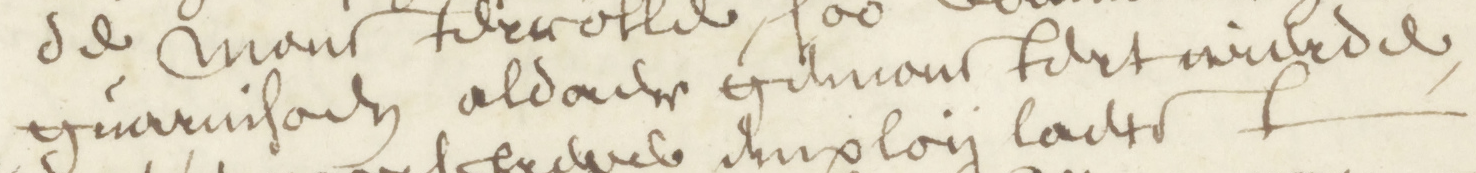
guarnisoen aldaer gemonstert wierde
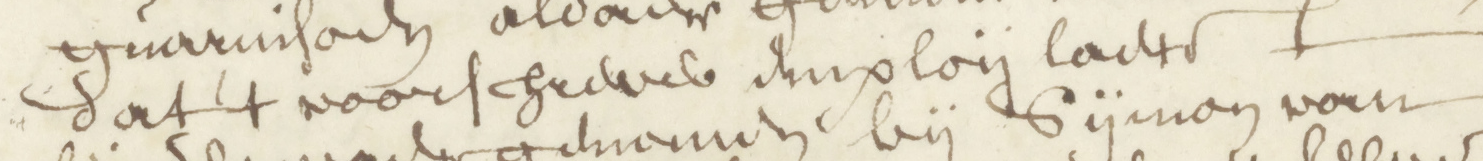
dat ‛t voorschreve emploij laets
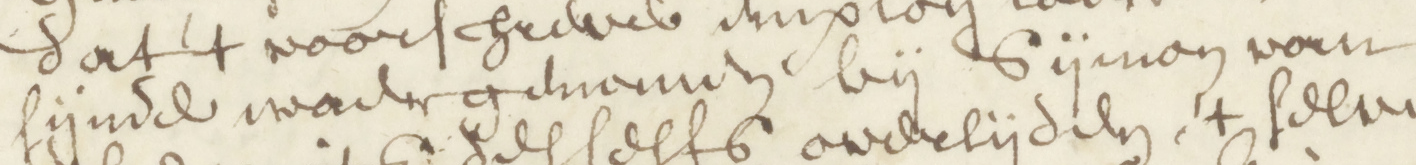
sijnde waergenomen bij Sijmon van
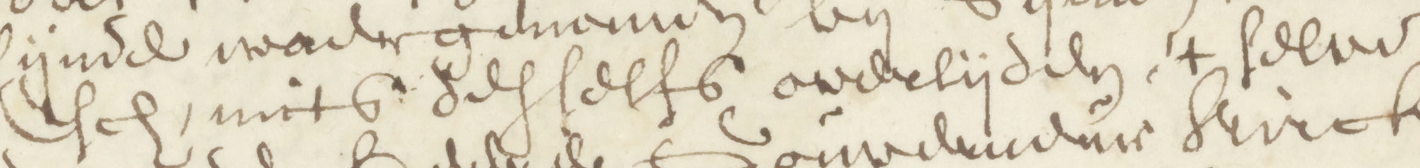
Esch, mits desselfs overlijden, 't selve
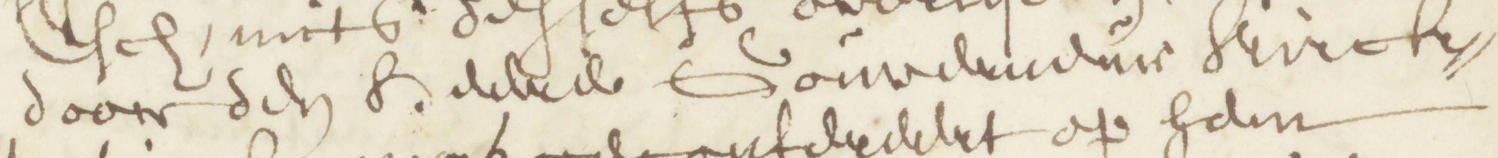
door den Heere Gouverneur Kirck,,
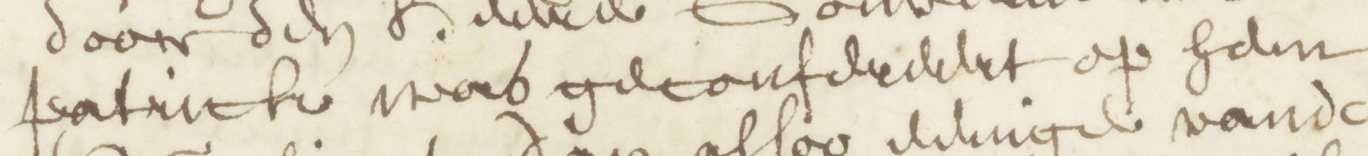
patrick was geconfereert op hem
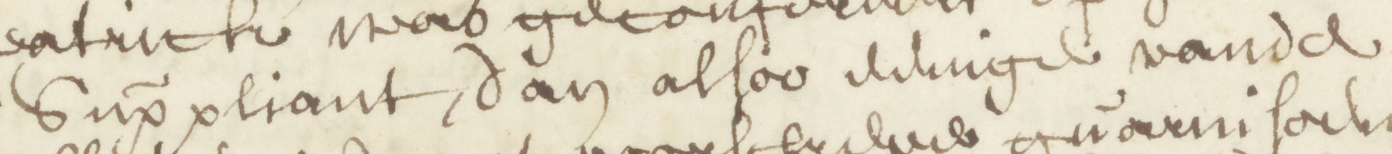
Suppliant, dan alsoo eenige vande
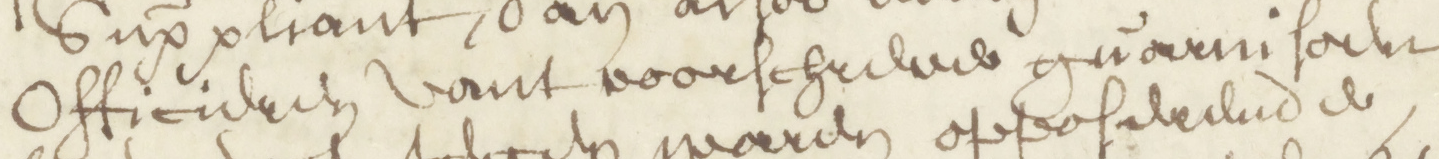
Officieren vant voorschreve guarnisoen
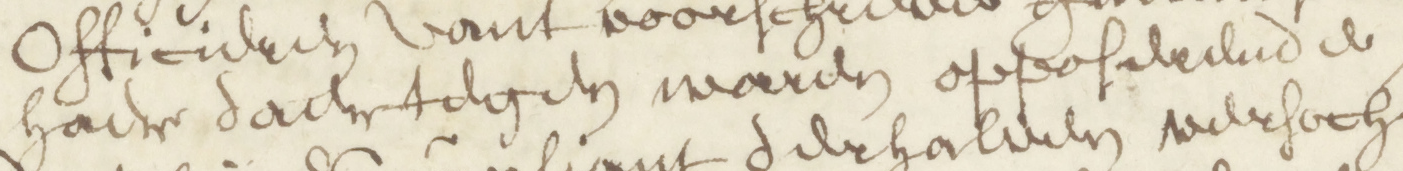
haer daertegen waren opposerende
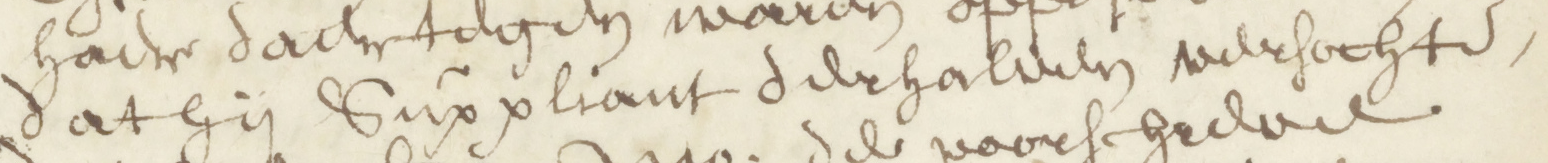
dat hij Suppliant derhalven versochte,
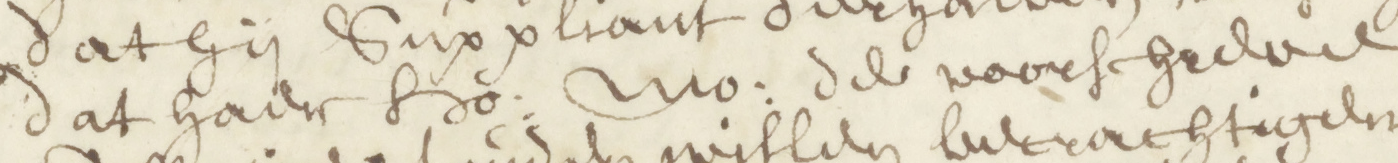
dat haer Ho:Mo: de voorschreve
